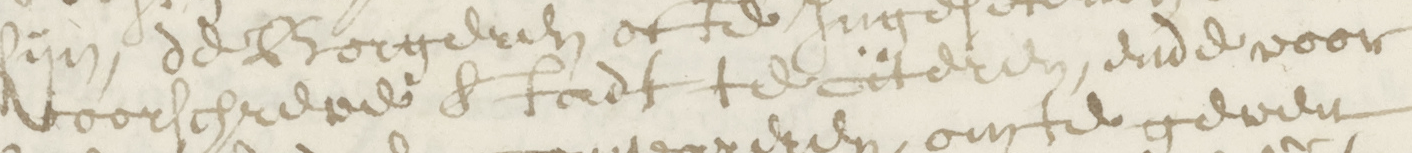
voorschreve Stadt te citeren, ende voor
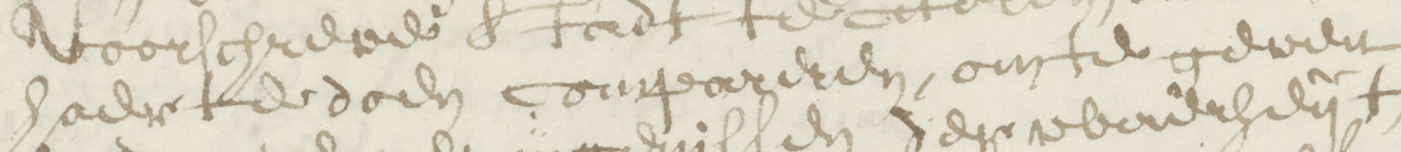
haer te doen compareren, om te geven
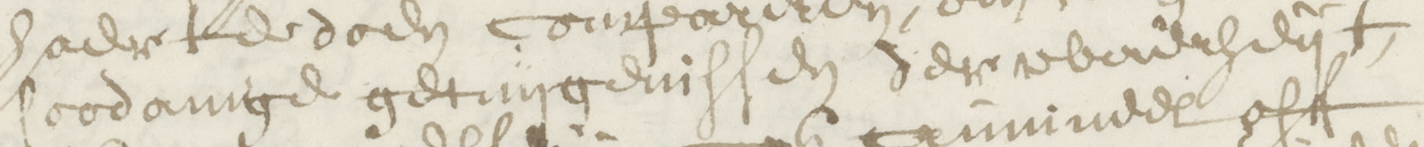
soodanige getuijgenissen der waerheijt,
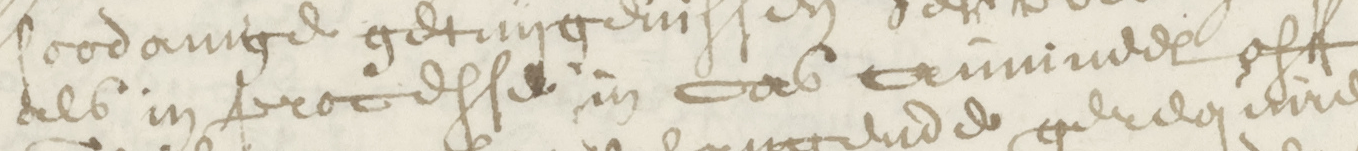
als in processe in cas crimineel off
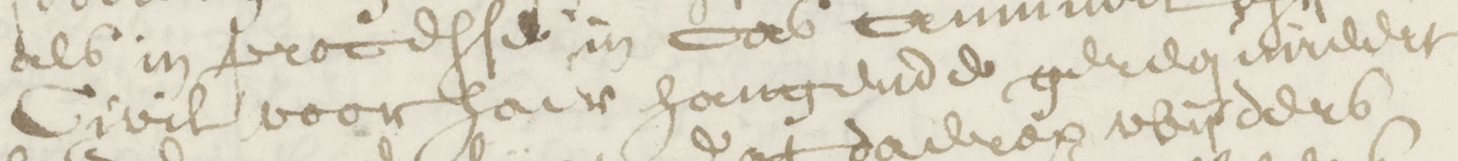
Civil voor haer hangende gerequireert
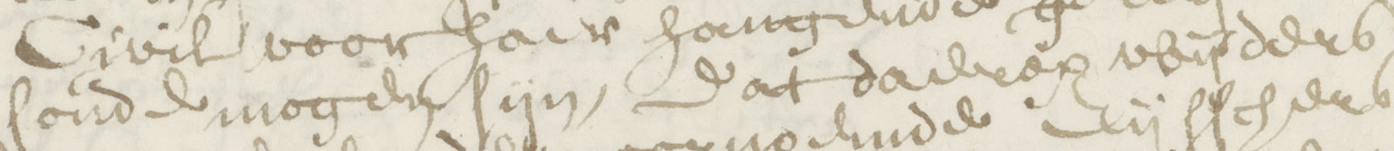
soude mogen sijn, Dat daerop wijders
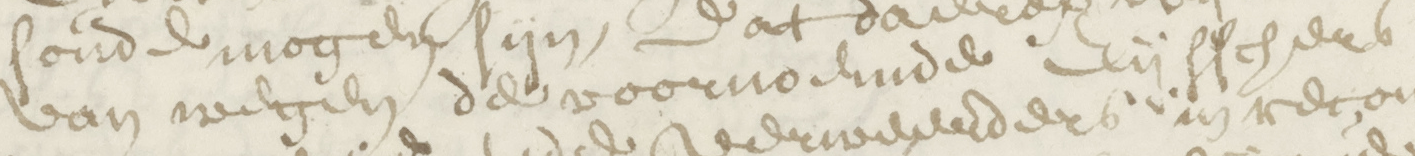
van wegen de voornoemde Eijsschers
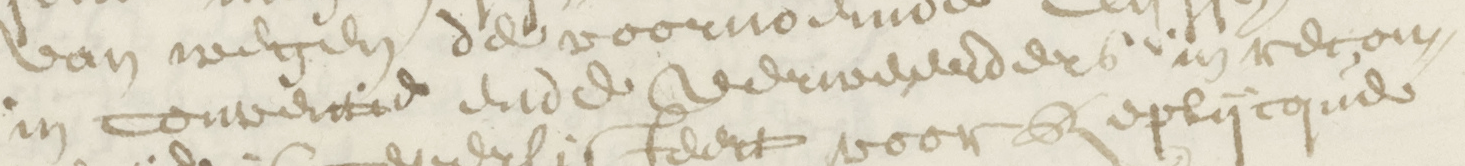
in conventie ende Verweerders in recon„
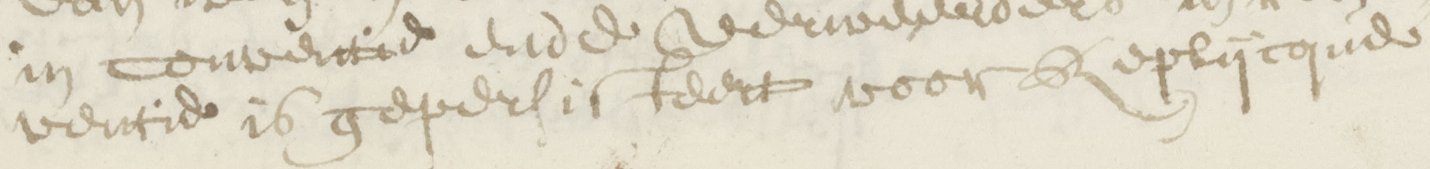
ventie is gepersisteert voor Replijcque
